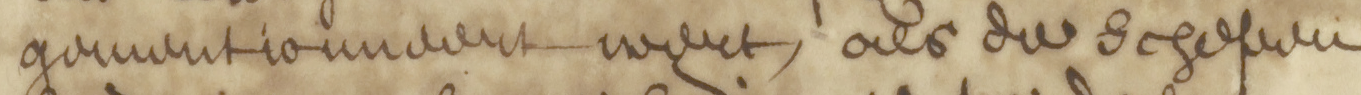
gementionneert wert, als de schepen
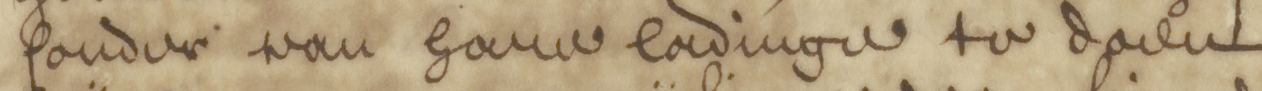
sonder van hare ladinge te doen
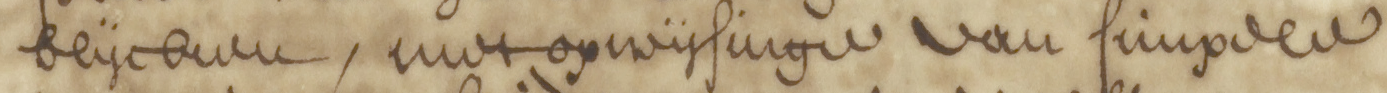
blijcken, met opwijsinge van simpele
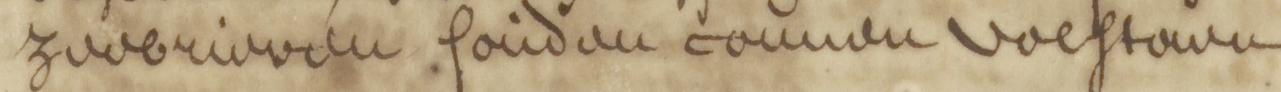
zeebrieven souden connen volstaen
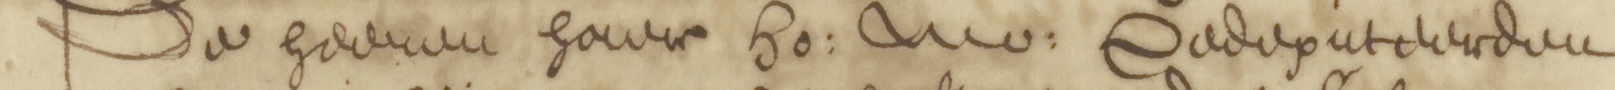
De heeren haer Ho:Mo: Gedeputeerden
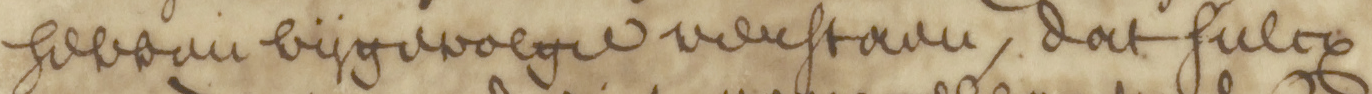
hebben bijgevolge verstaen, dat sulcx
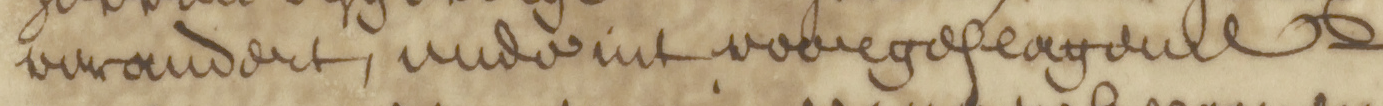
verandert, ende int voorgeslagene
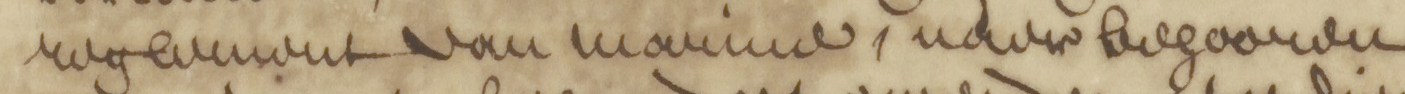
reglement van marine, naer behooren
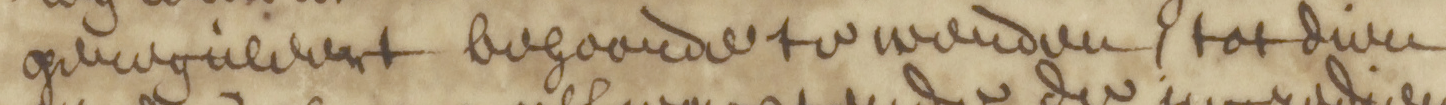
gereguleert behoorde te werden, tot dien
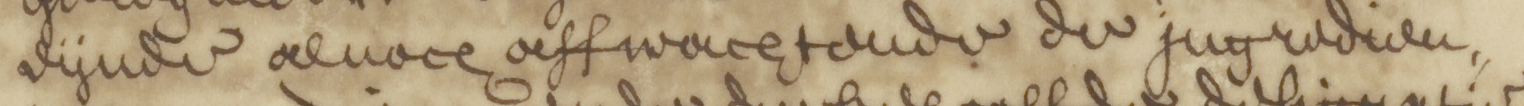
eijnde alnoch aft wachtende de ingredien,,
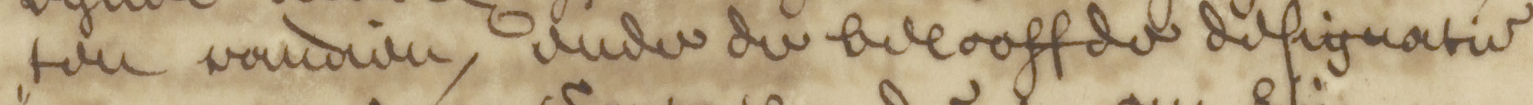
,,ten vandien, ende de belooffde designatie
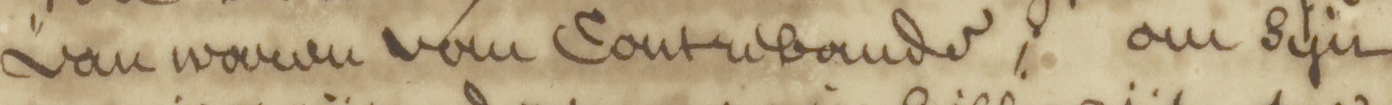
van waren van Contrebande, om sijn
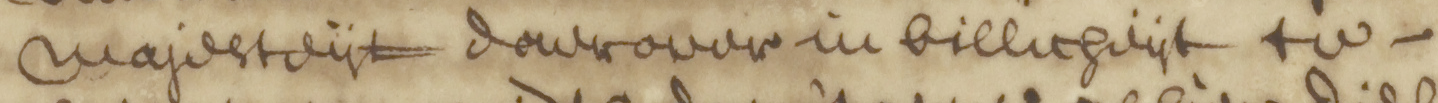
majesteijt daerover in billicheijt te
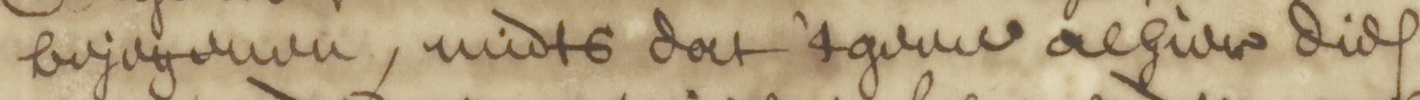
bejegenen, midts dat 't gene alhier dies
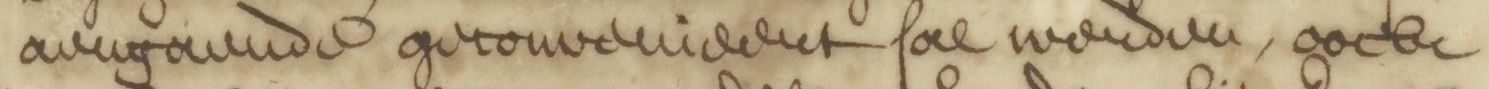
aengaende geconveneert sal werden, oock
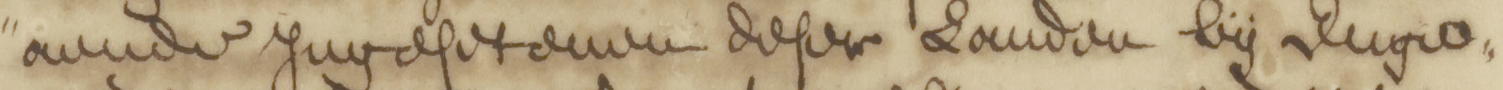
aende Ingesetenen deser landen bij Enge,,
